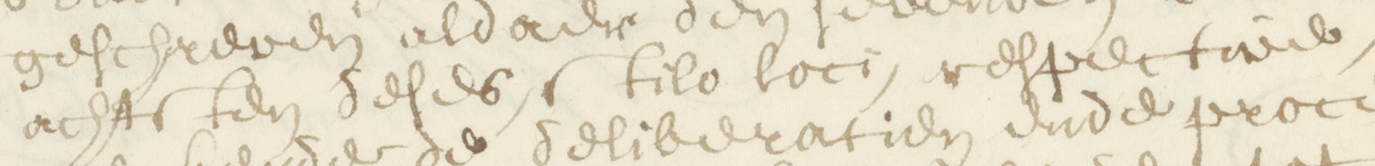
achtsten deses, stilo loci, respective
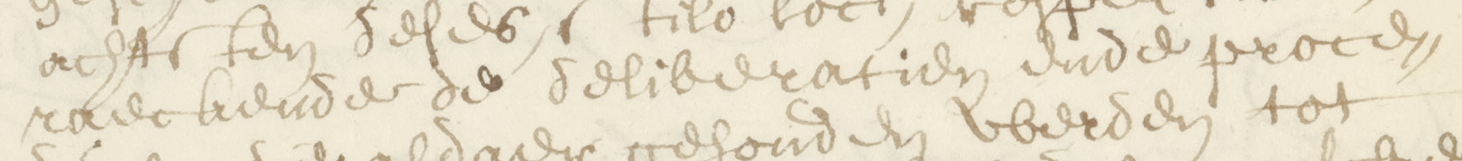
raeckende de deliberatien ende proce„
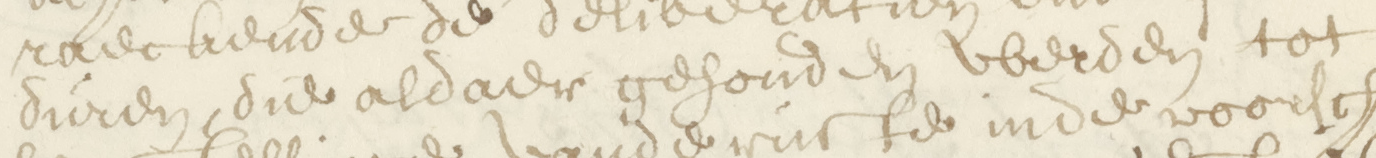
duren, die aldaer gehouden werden tot
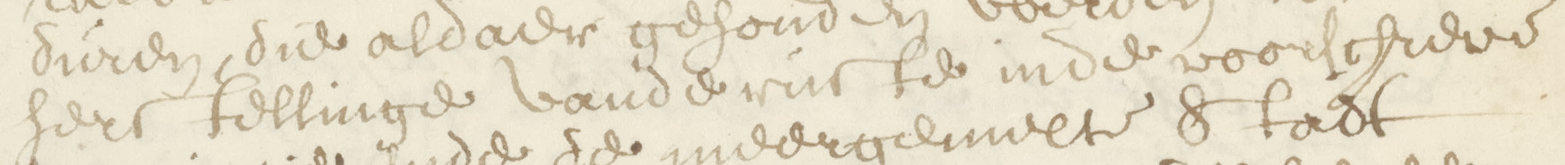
herstellinge vande ruste inde voorschreve
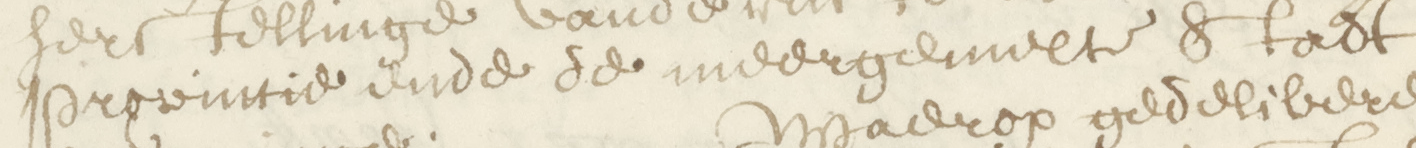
provintie ende de meergemelte Stadt
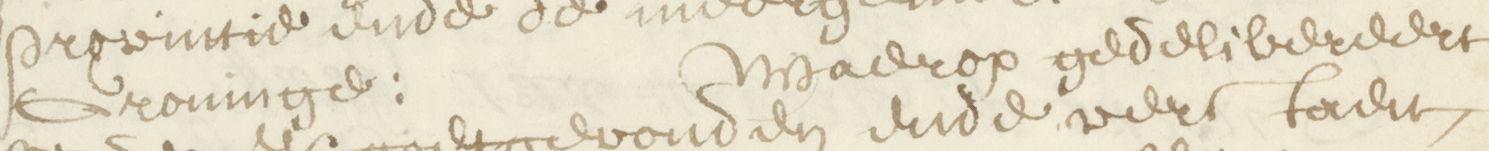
Groninge: Waerop gedelibereert
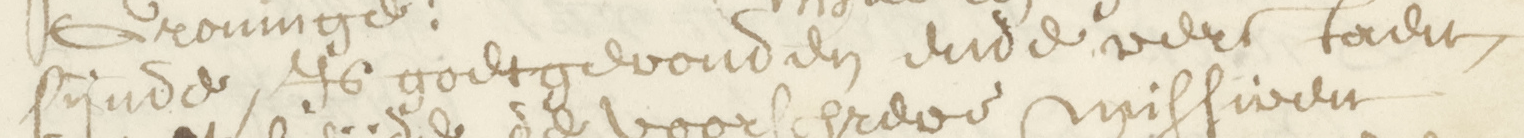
sijnde, Is goetgevonden ende verstaen,
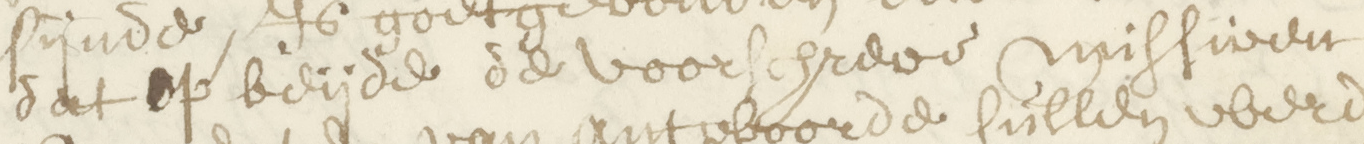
dat op beijde de voorschreve missiven
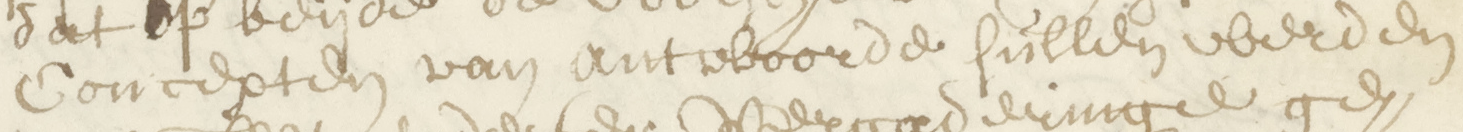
concepten van antwoorde sullen werden
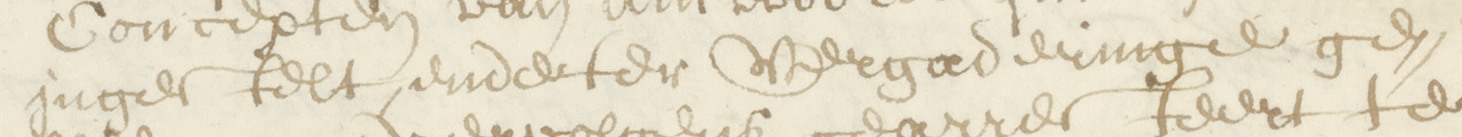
ingestelt, ende ter Vergaderinge ge„
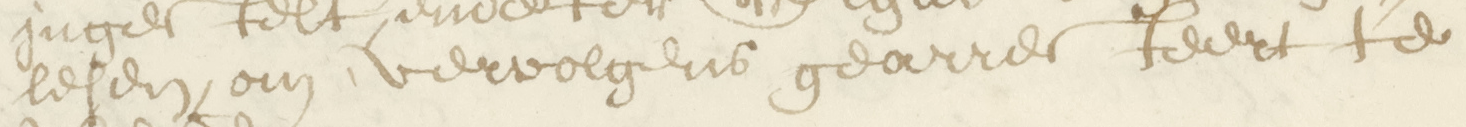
lesen, om vervolgens gearresteert te
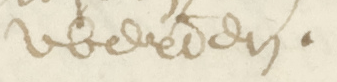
werden.
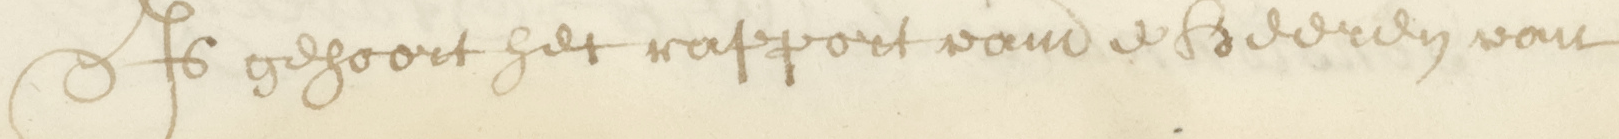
Is gehoort het rapport vande Heeren van
